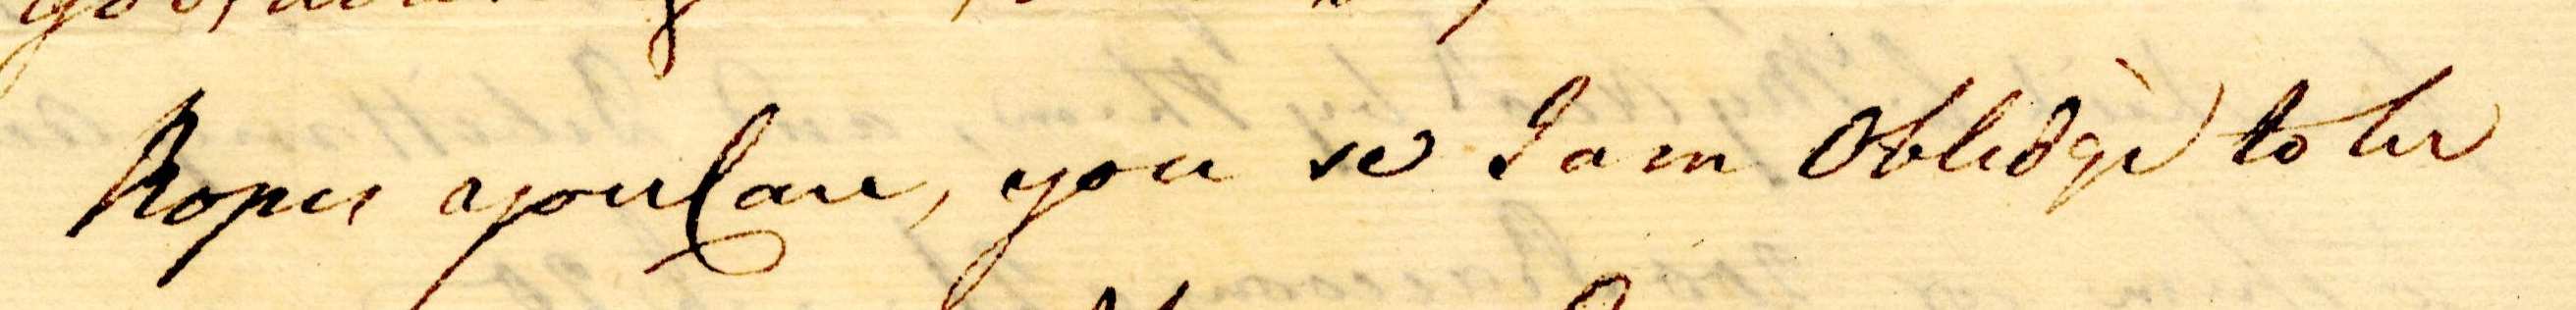Ropes you care, you se I am Oblidge to be
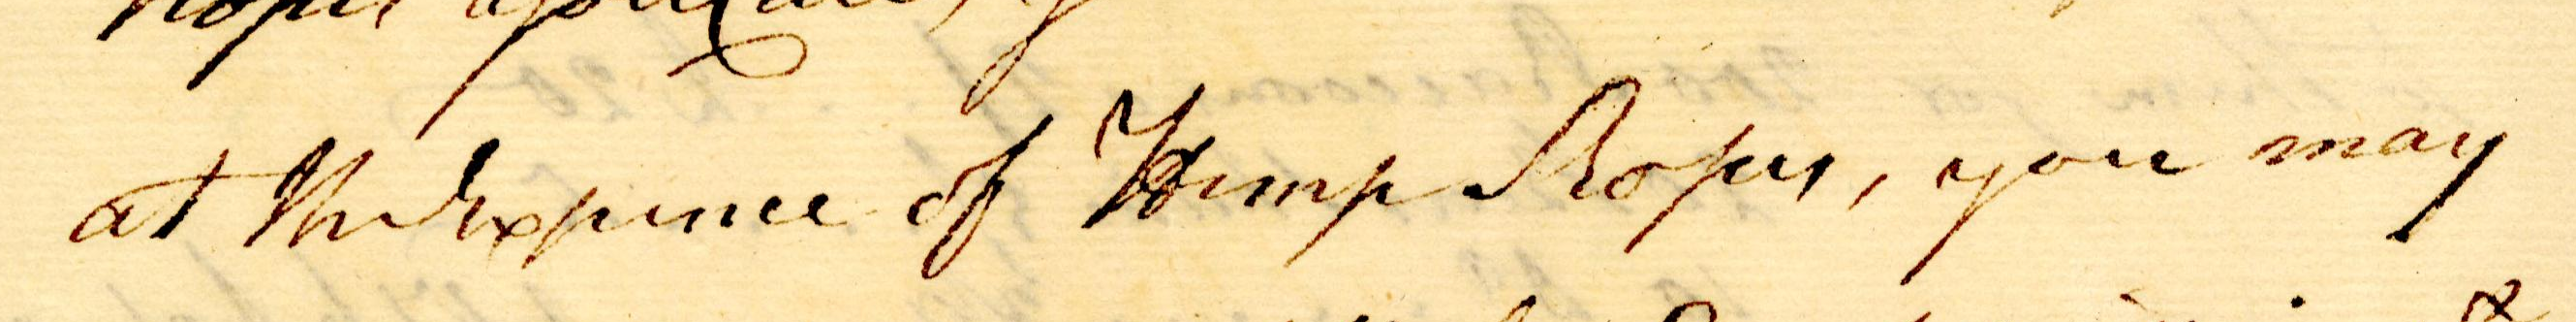at the expence of Hemp Ropes, you may
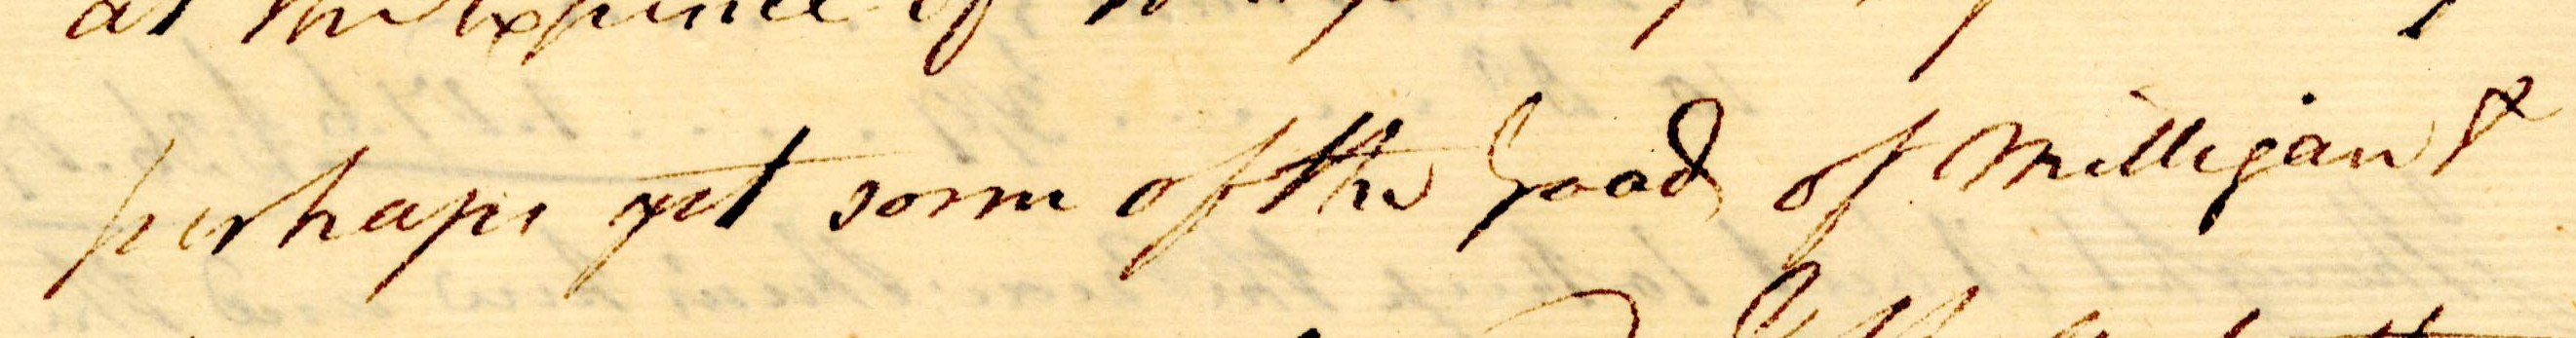perhaps get some of the goods of Milligan &
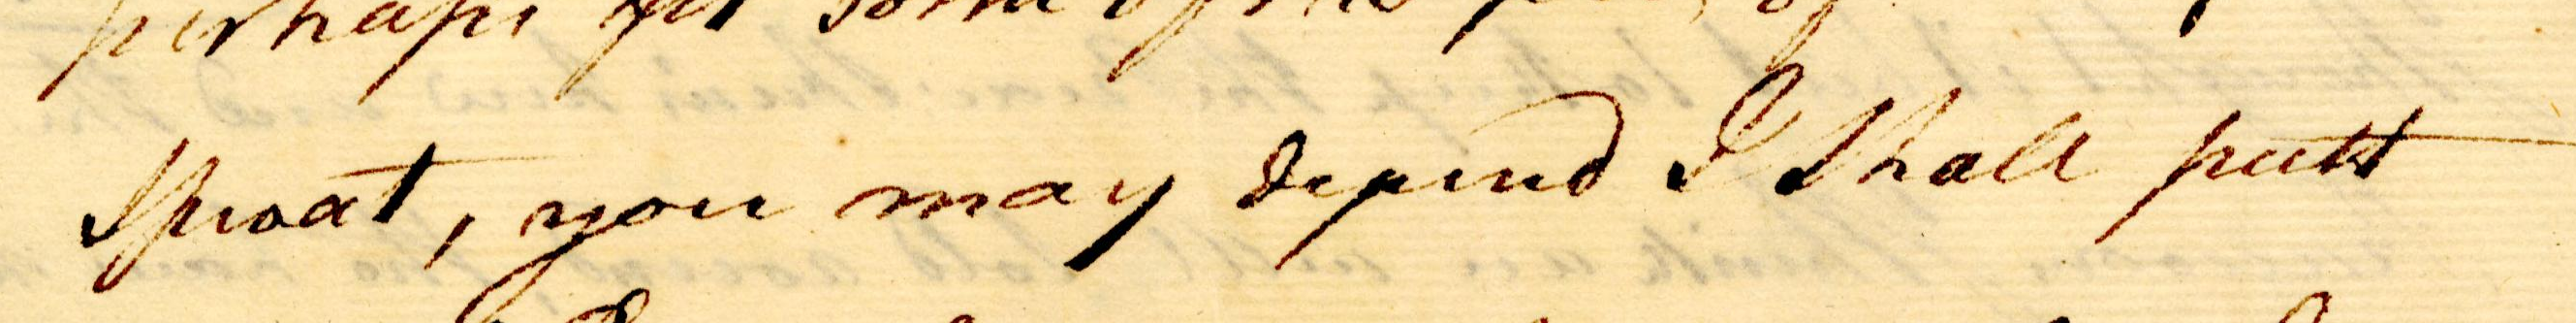Sproat, you may depend I shall putt
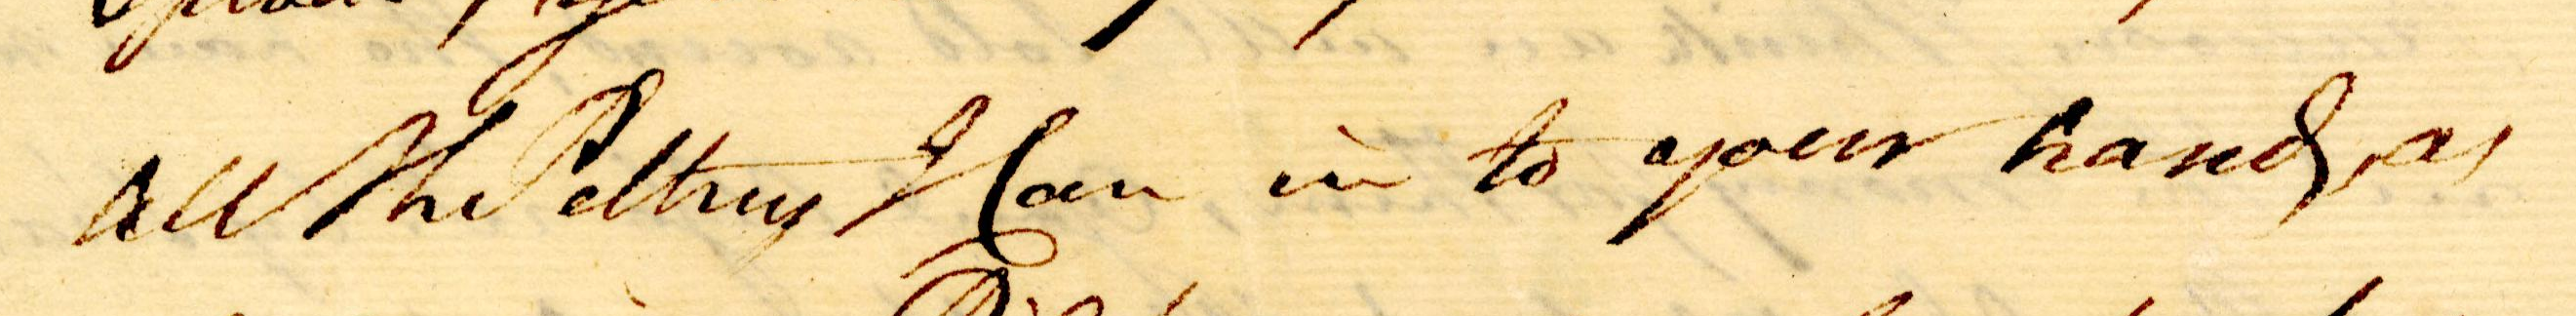all the Peltry I Can in to your hands as
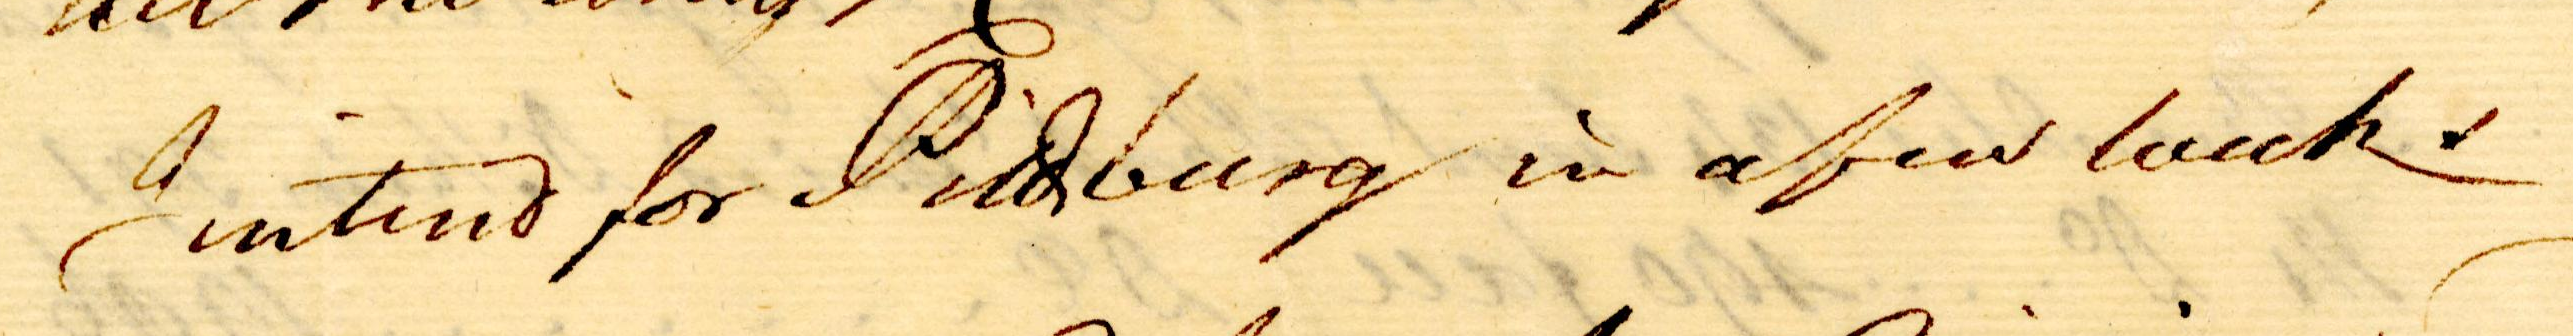I intend for Pitdsberg in a few weeks
